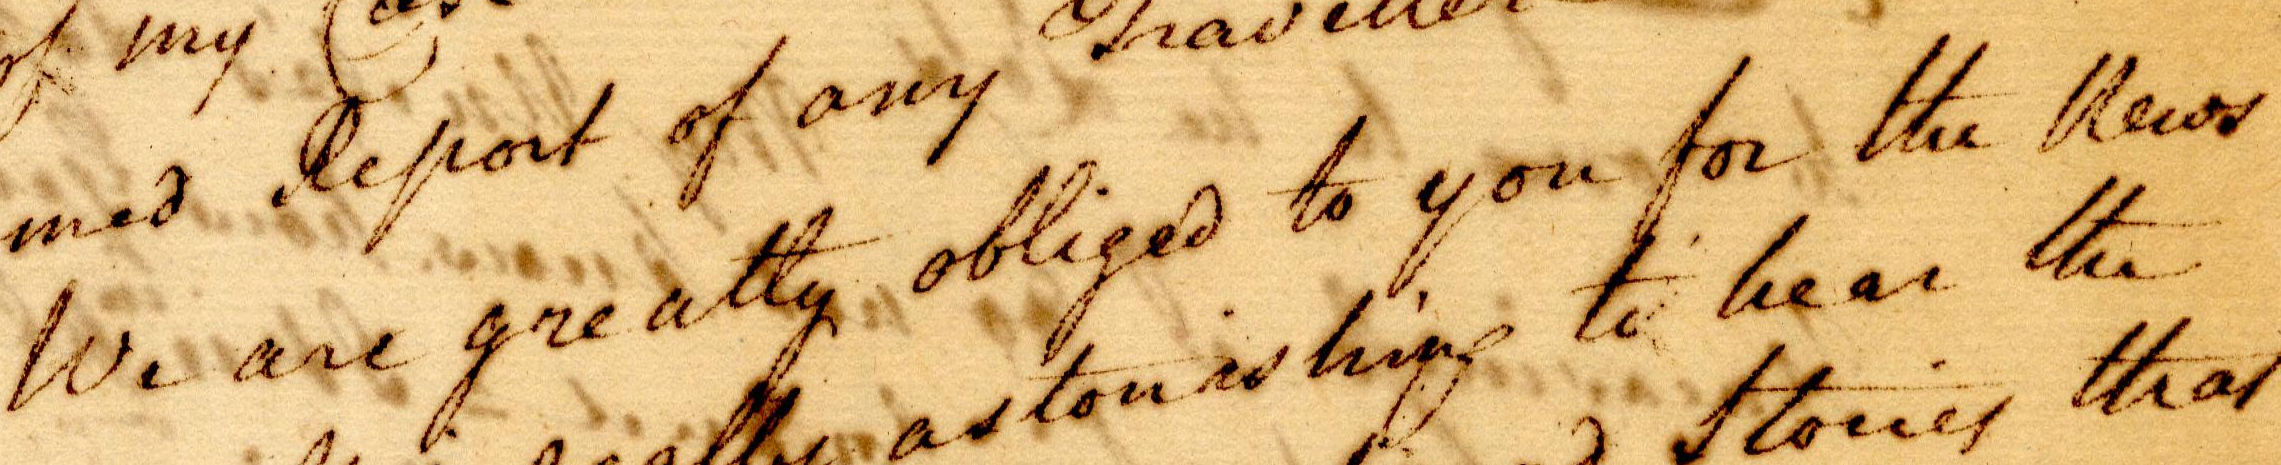We are greatly obliged to you for the News
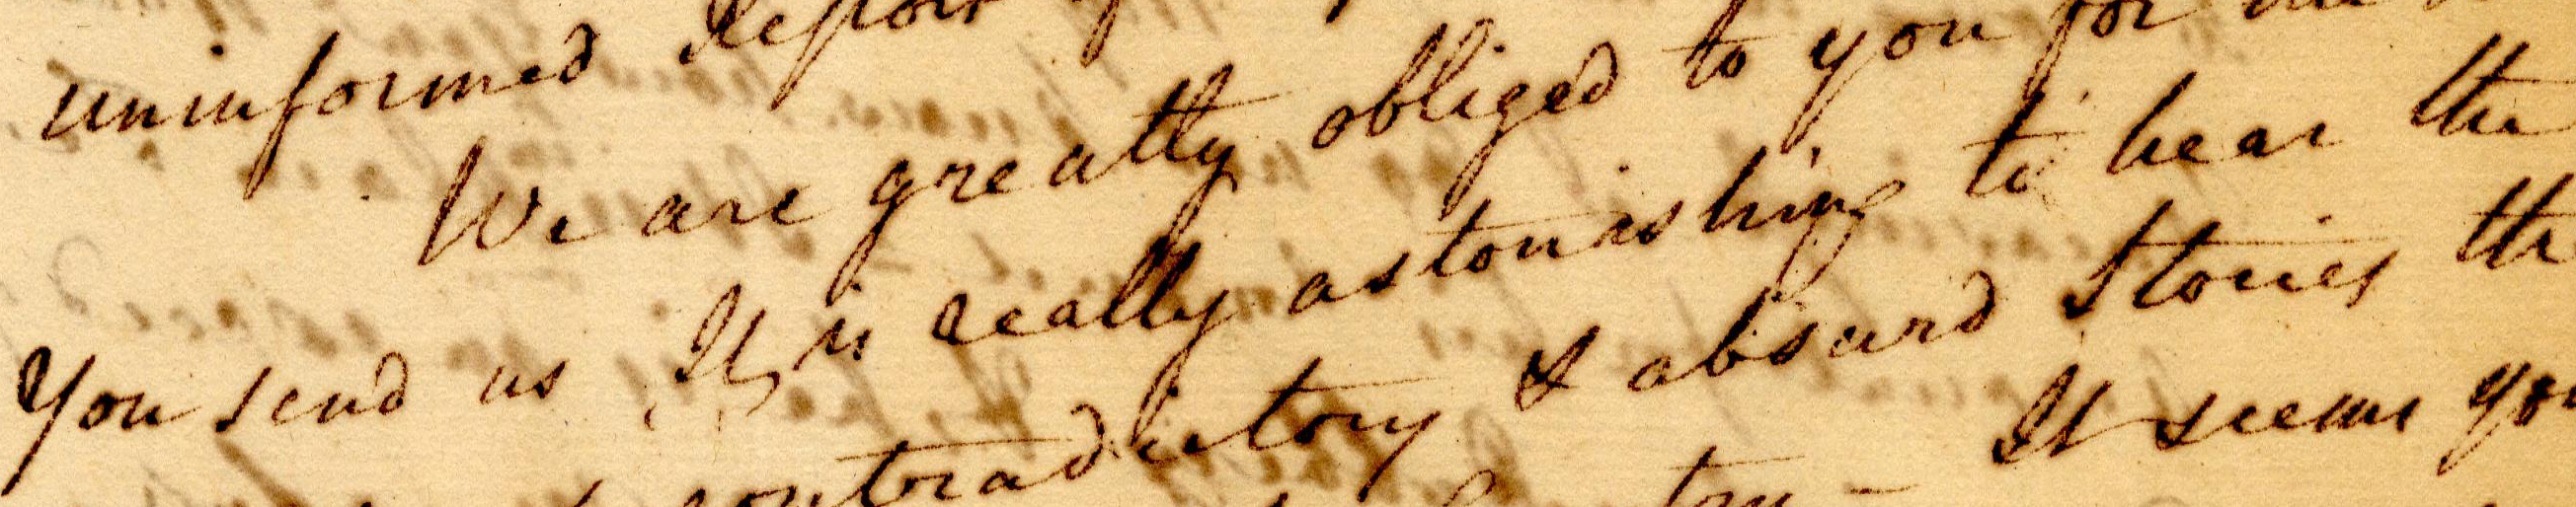You send us. It is really astonishing to hear the
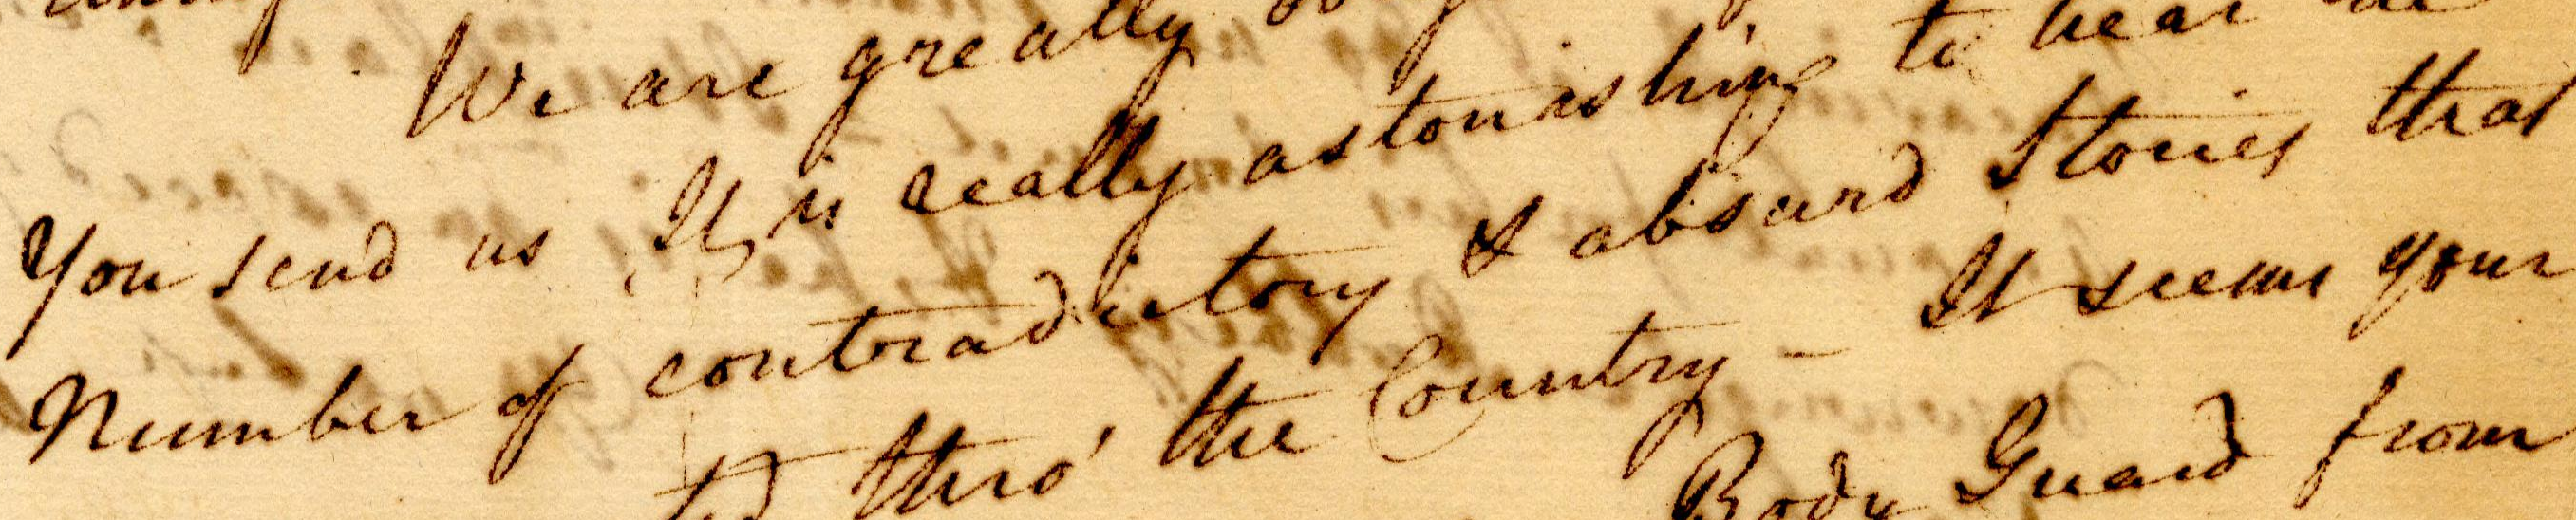Number of contradictory & absurd Stories that
